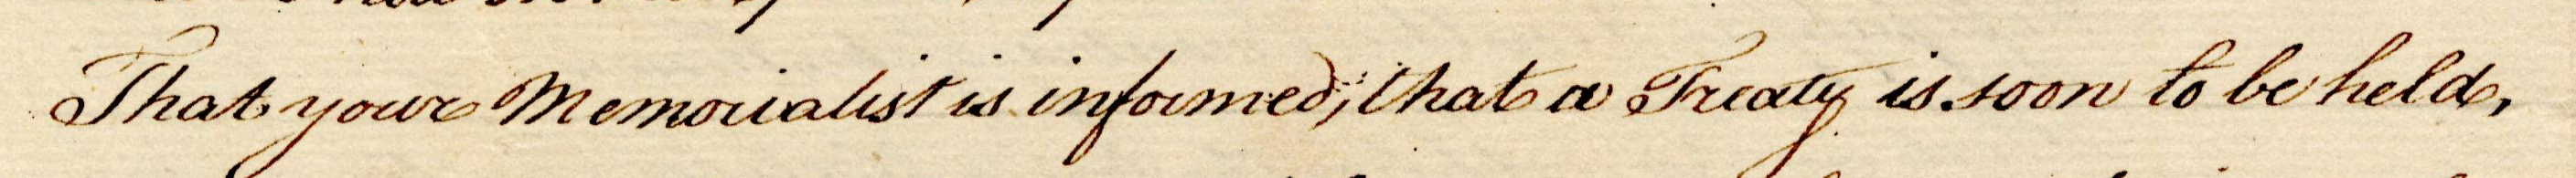That your memorialist is informed, that a treaty is soon to be held,
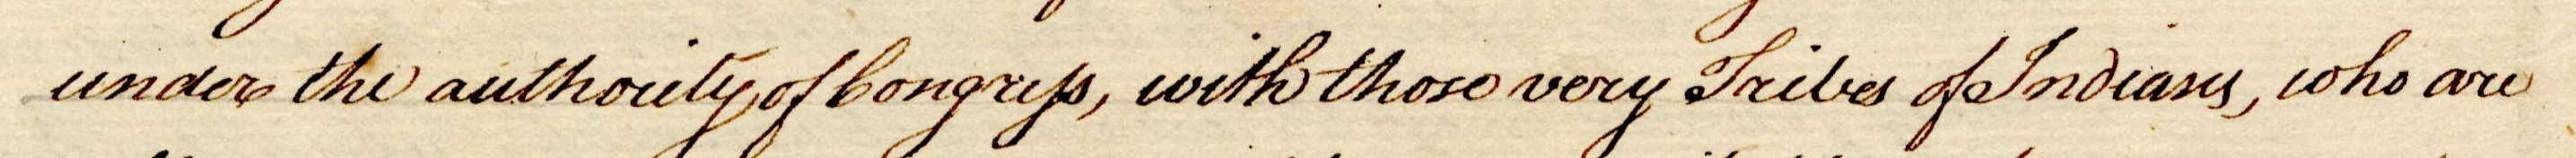under the authority of Congress, with those very Tribes of Indians, who are
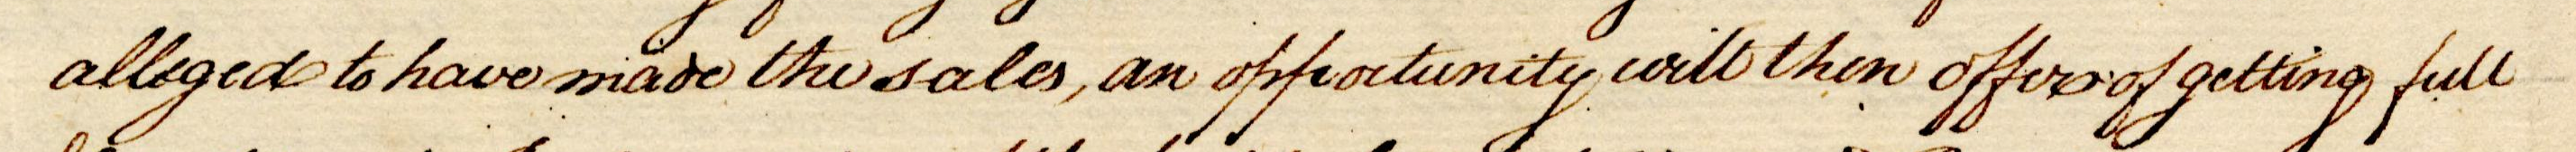alleged to have made the sales, an opportunity will then offers of getting full
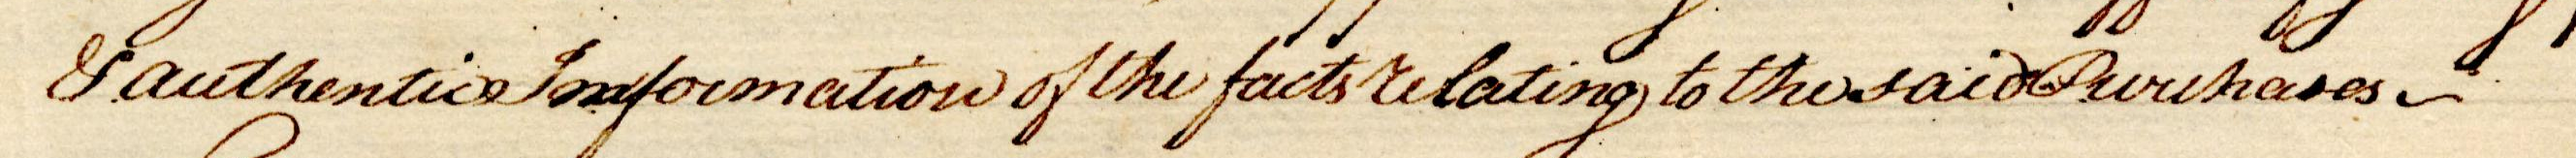& authentic Information of the facts relating to the said Purchases-
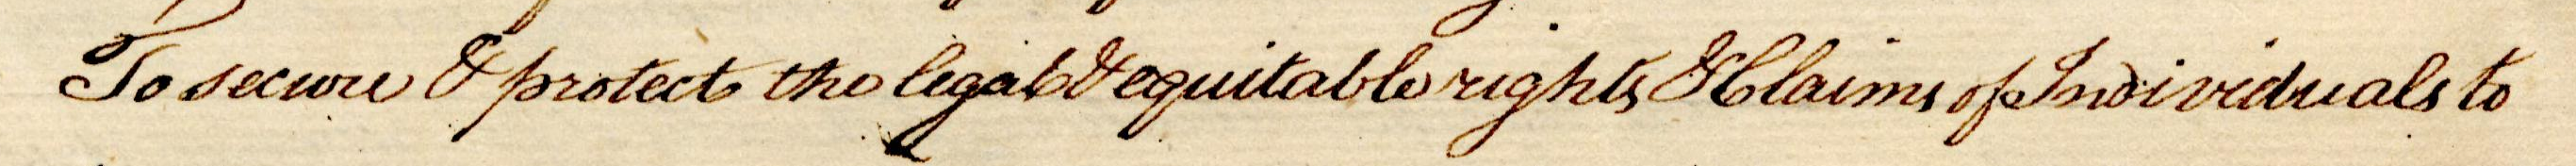To secure & protect the legal & equitable rights & Claims of Individuals to
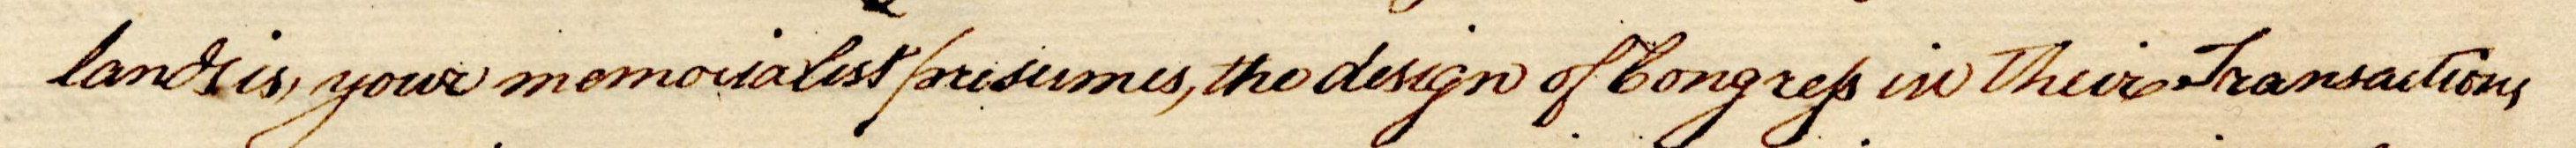land is, your memorialist presumes, the design of Congress in their Transactions,
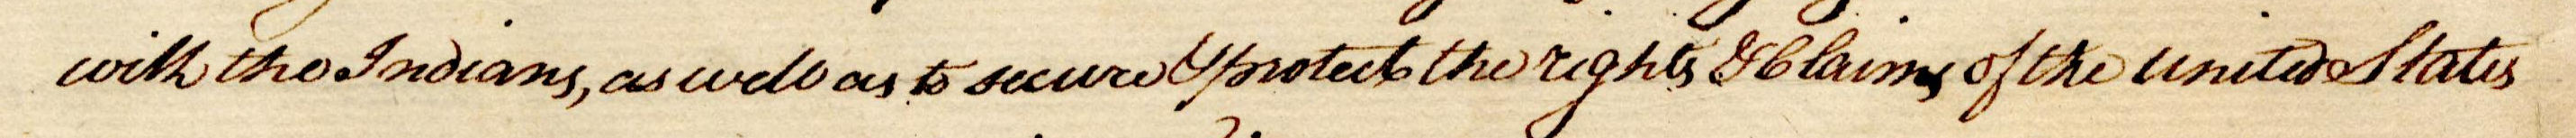with the Indians, as well as to secure& protect the rights & Claims of the United States
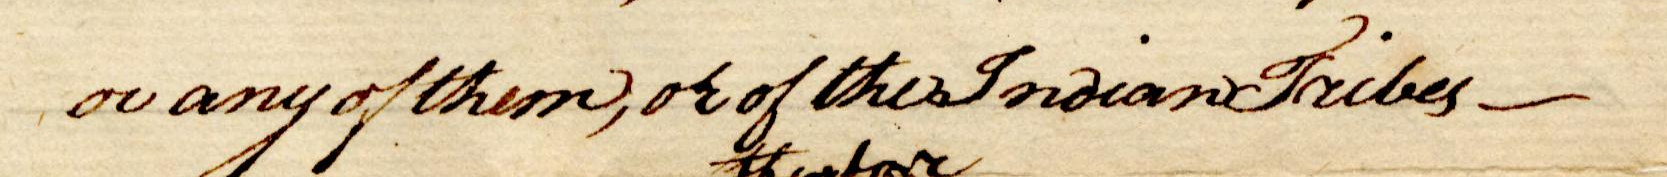or any of them, or of the Indian Tribes-
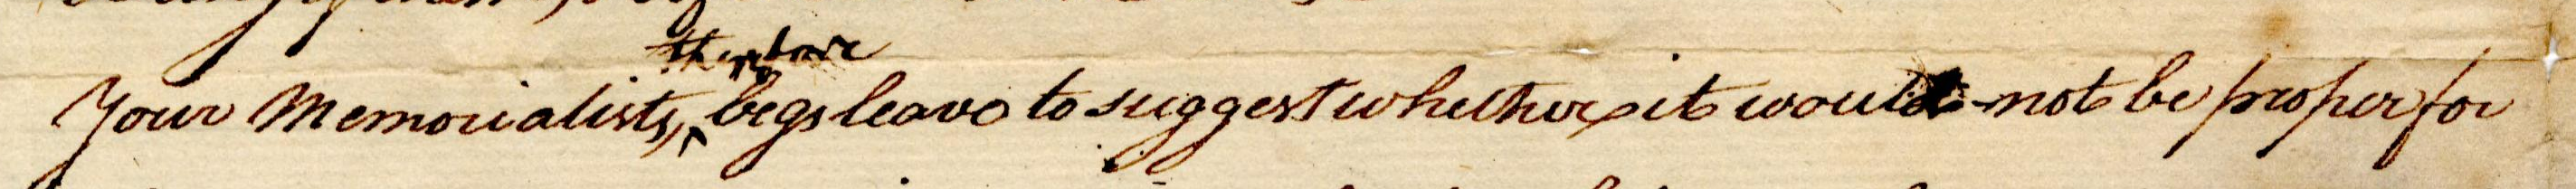Your Memorialist, ^ begs leave to suggest whether it would not be proper for
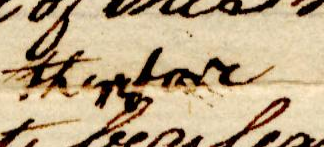therefore
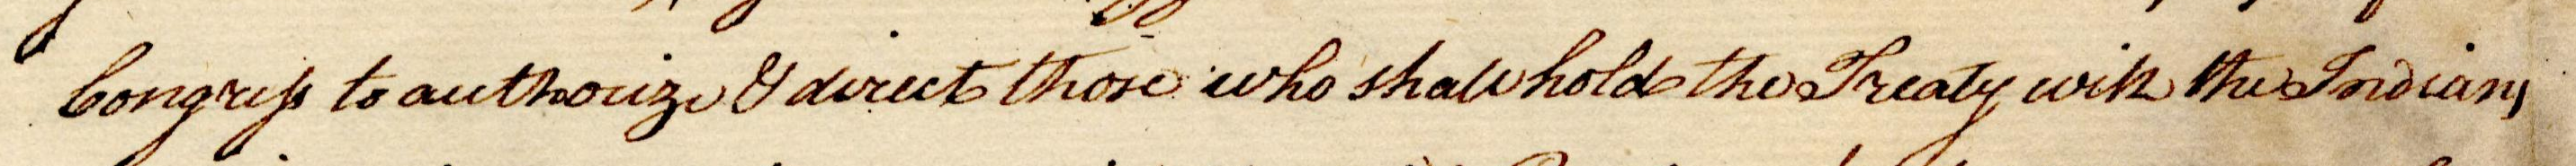Congress to authorize & direct those who shall hold the Treaty with the Indians
